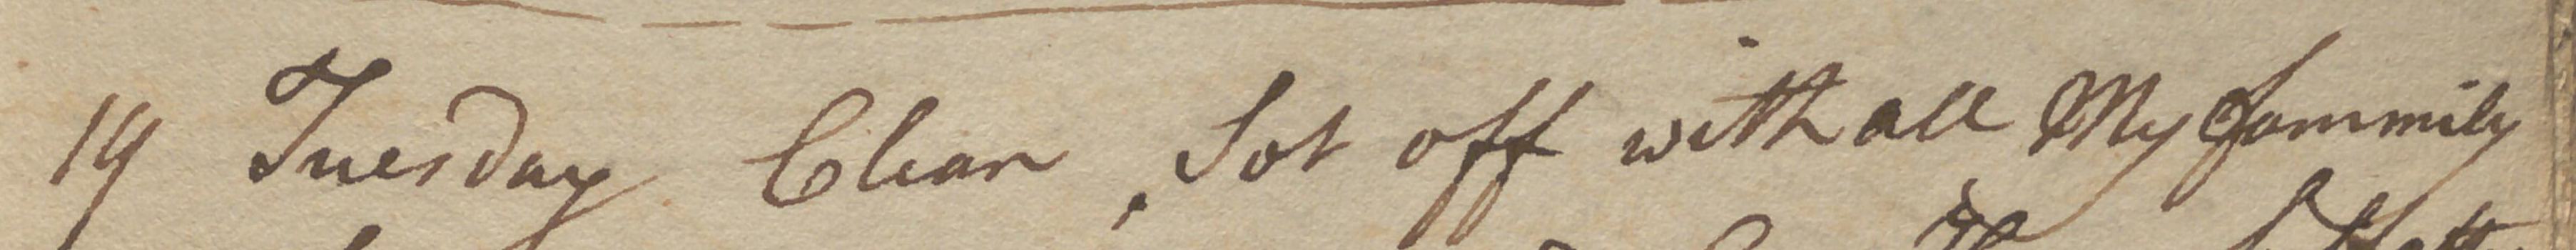19 Tuesday Clear Sot off with all My fammily
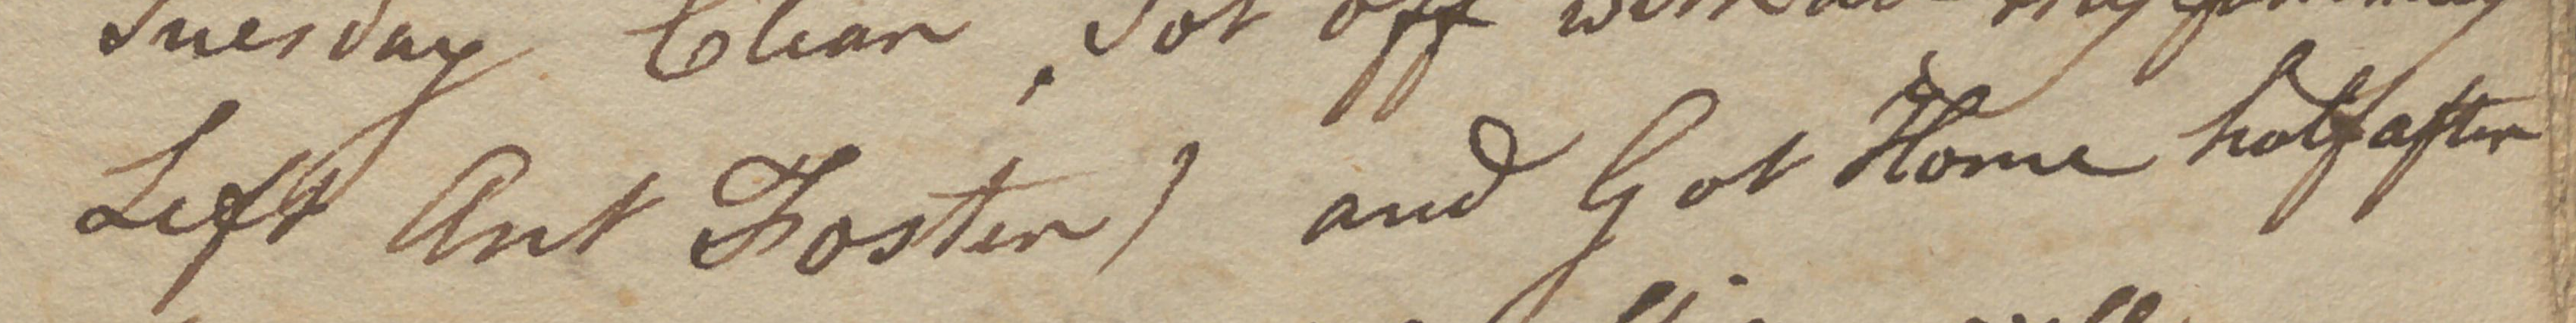Left Ant Foster) and Got Home half after
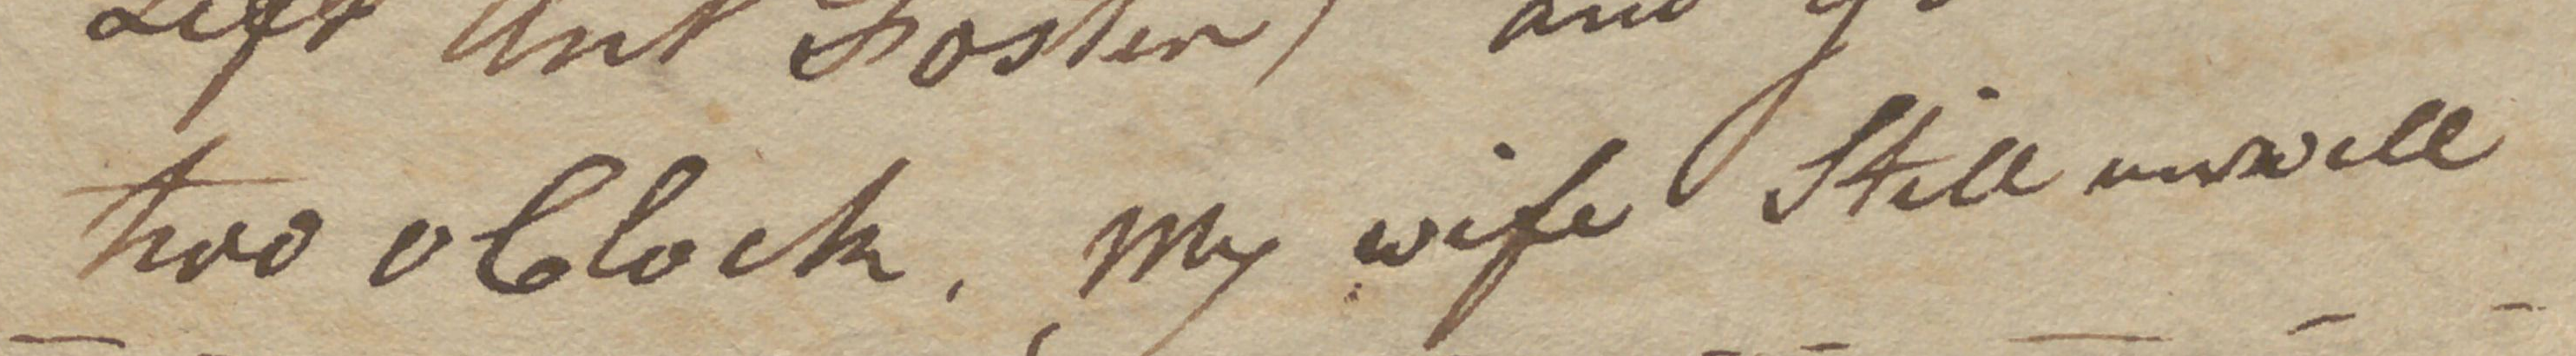too oClock, My wife Still unwell
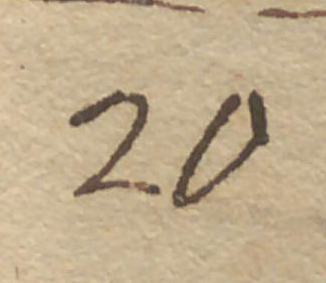20
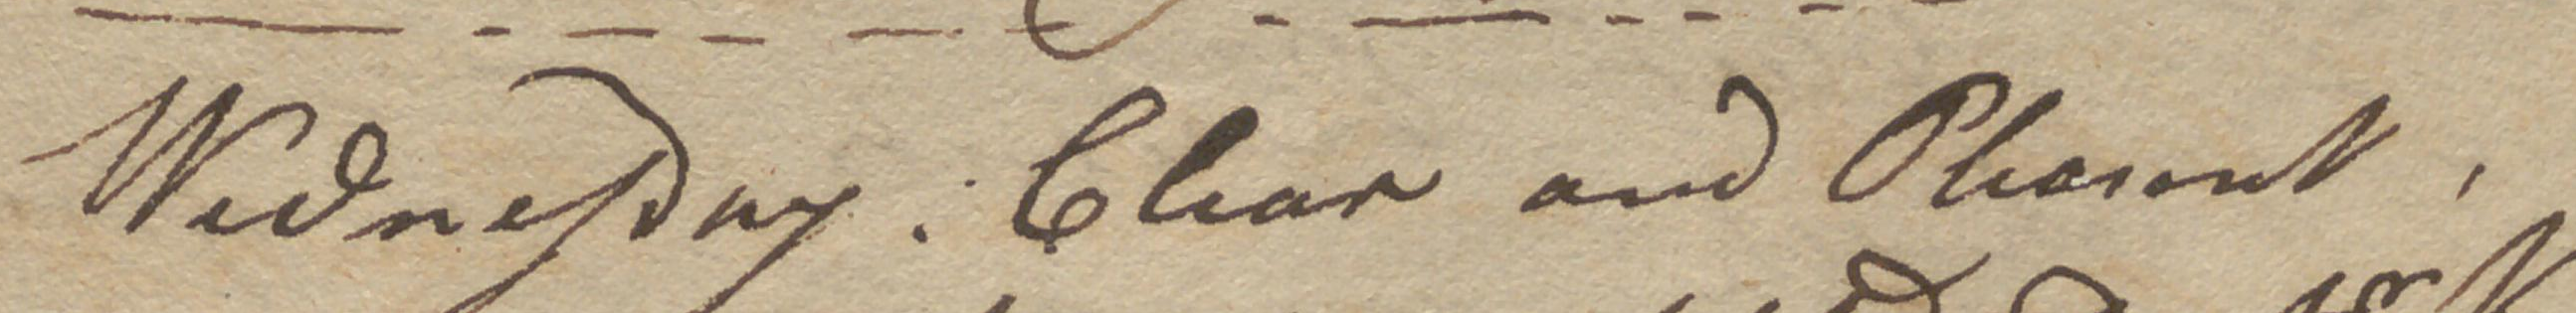Wednesday. Clear and Pleasent,
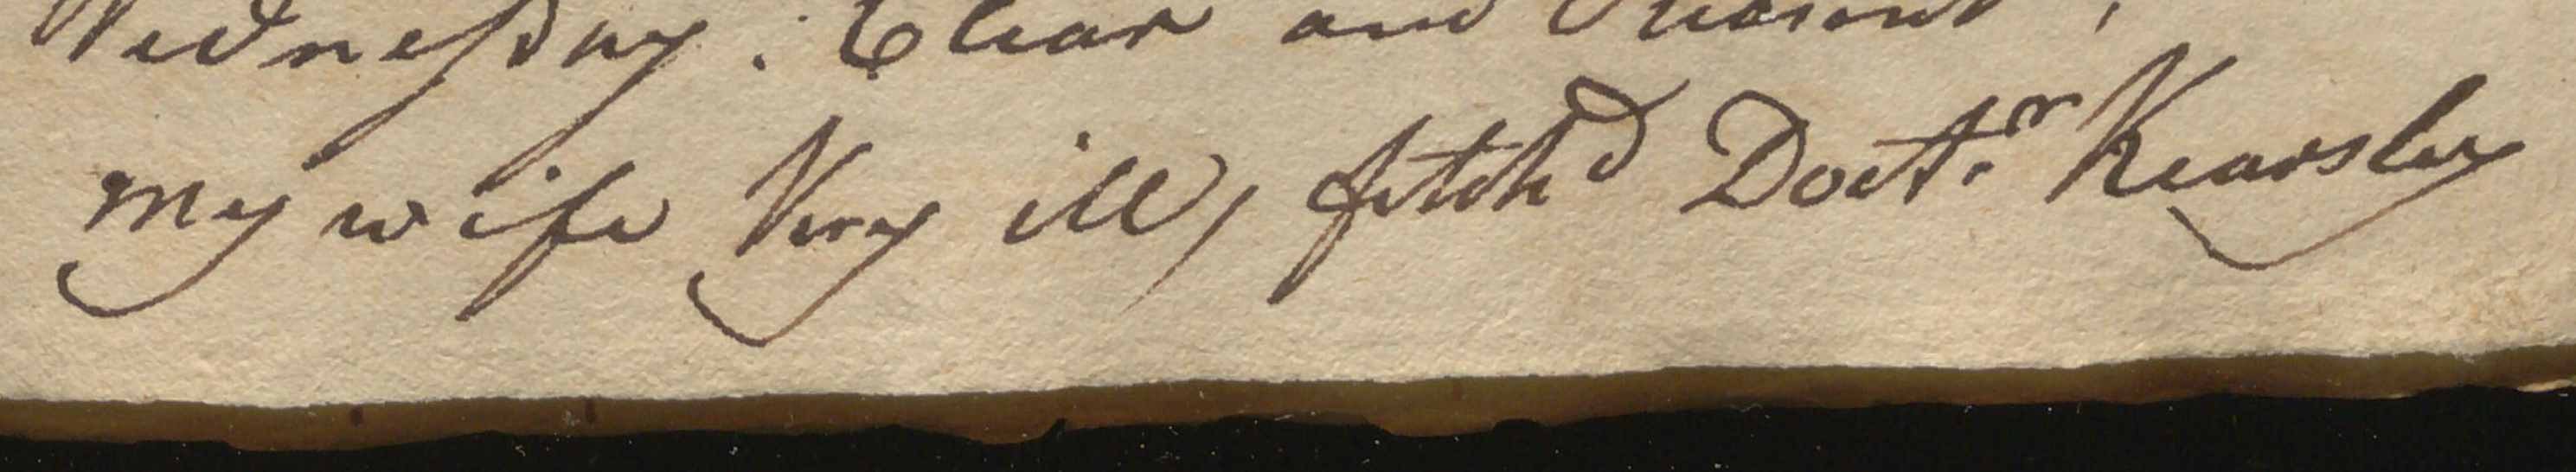my wife very ill, fetchd Doct^r. Kearsly
